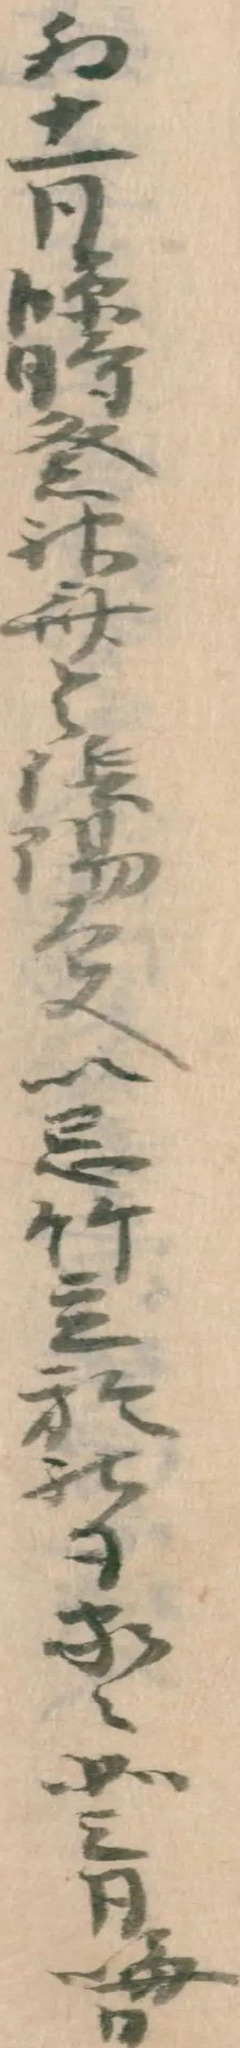同日為十一月臨時祭神斎令陰陽大夫以忌竹立於社司家々如三月晦日
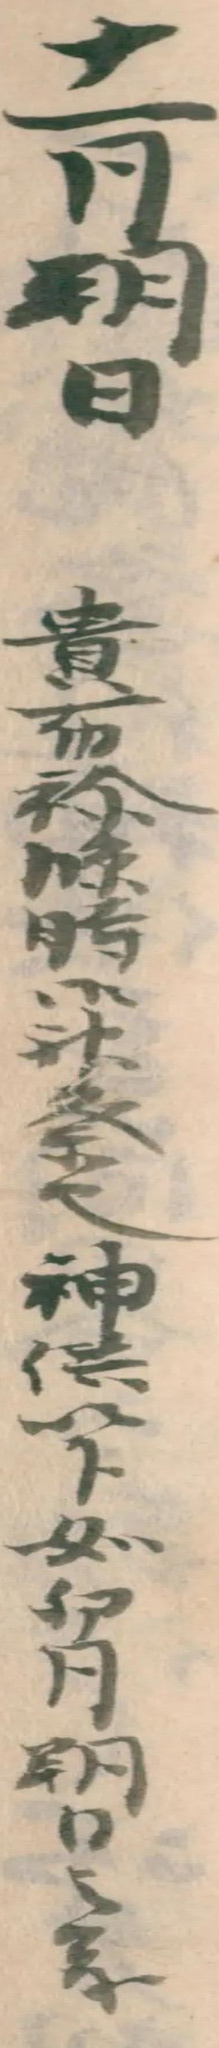十一月朔日貴ふね臨時御神祭也神供以下如卯月朔日之義
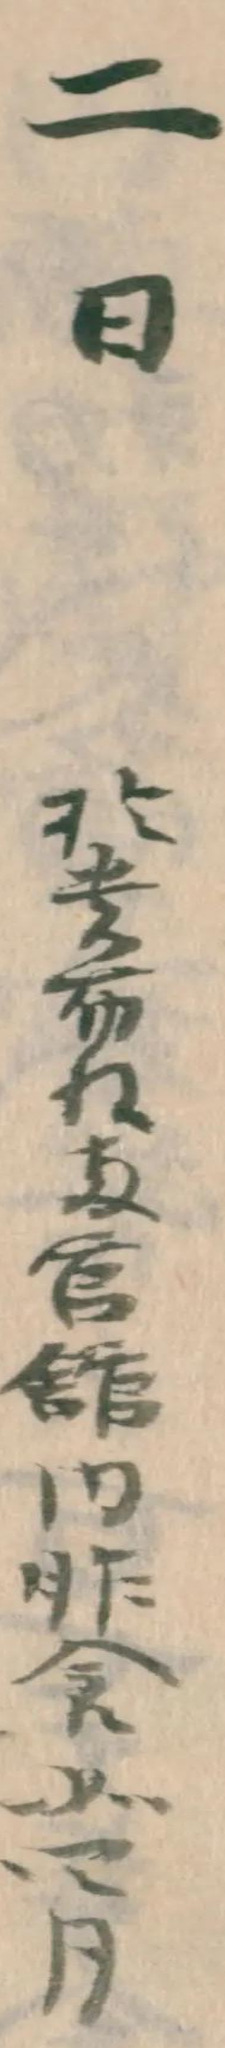二日於貴ふね両官館内胙食如四月
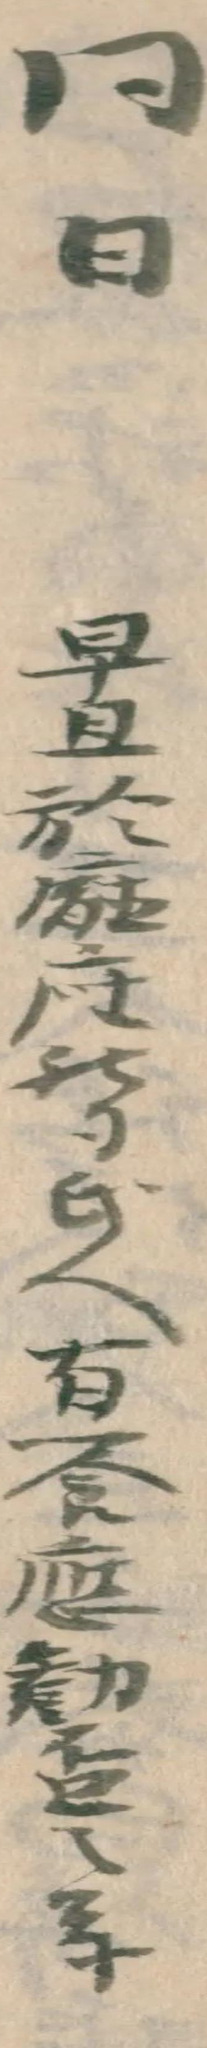同日早旦於庁座社司氏人有饗応勧盃之義
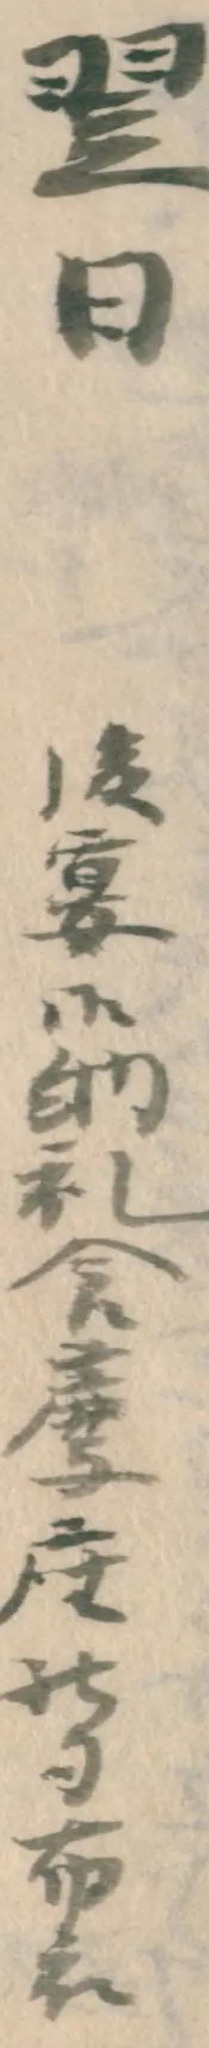翌日後宴御納礼食薦座社司布衣
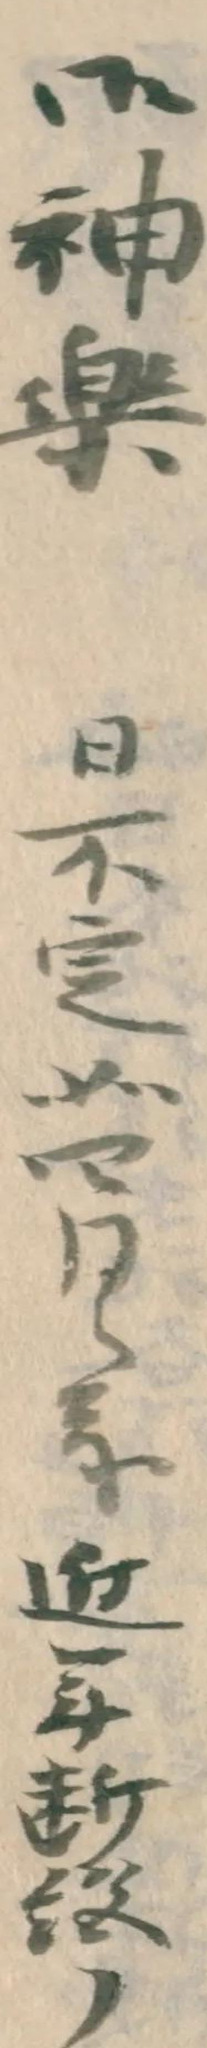御神楽日不定如四月之義近年断絶之
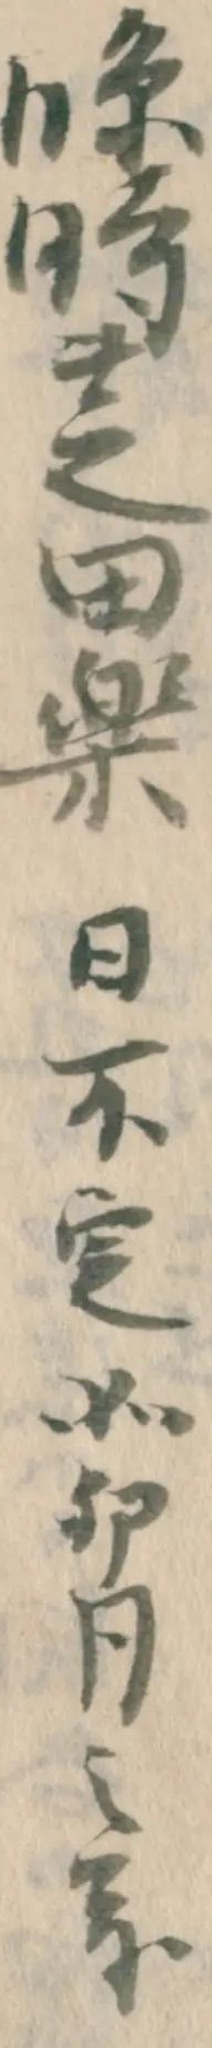臨時芝田楽日不定如卯月之義

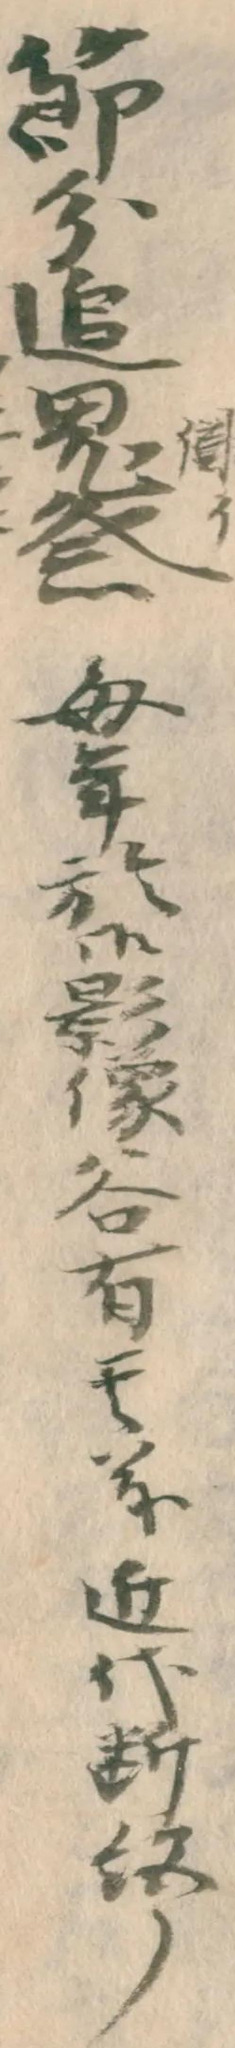節分追鬼祭毎年於御影像谷有其義近代断絶之
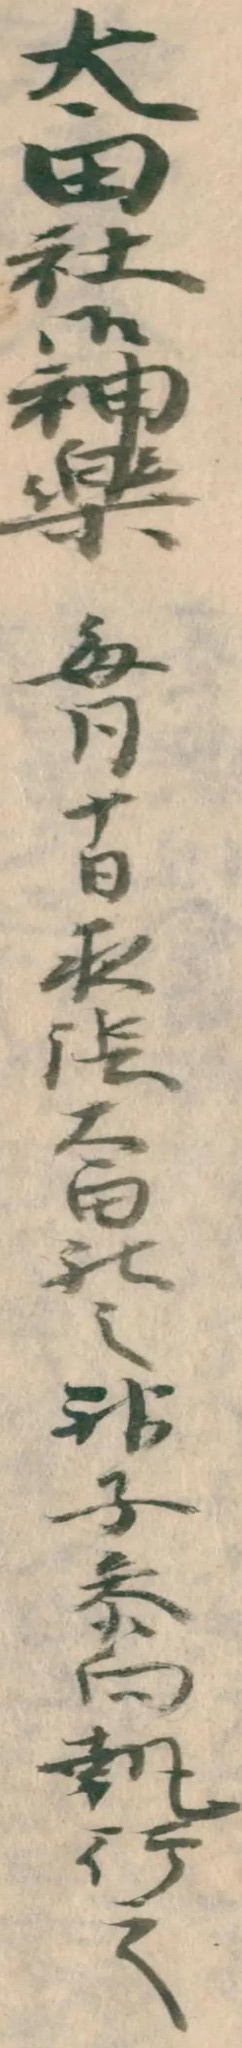太田社御神楽毎月十日夜陰太田社之神子参向執行之
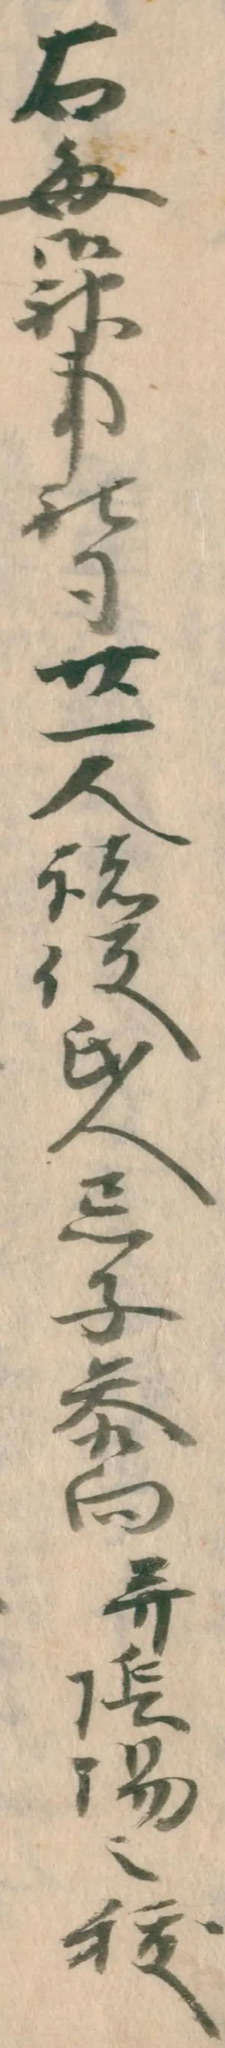右毎御神事社司廿一人諸役氏人忌子参向并陰陽之祓
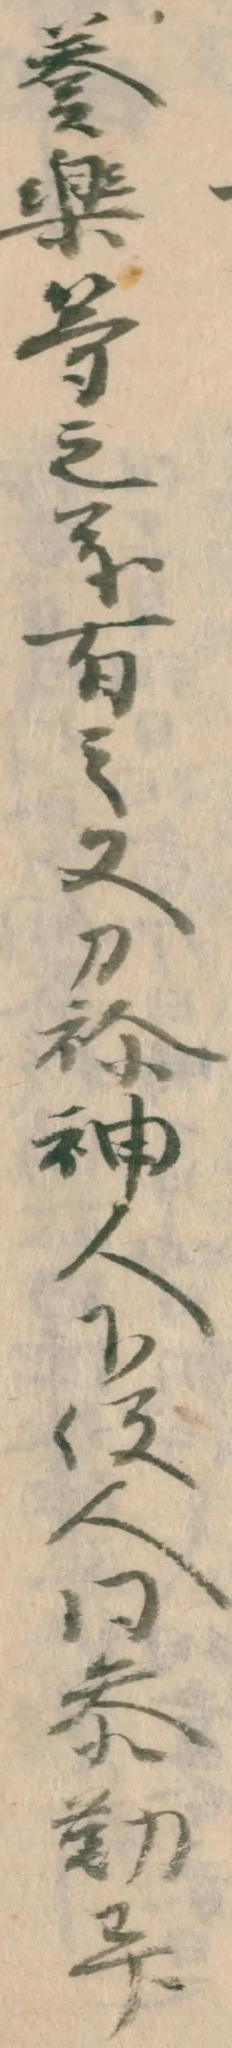奏楽等之義有之又刀祢神人下役人同参勤畢
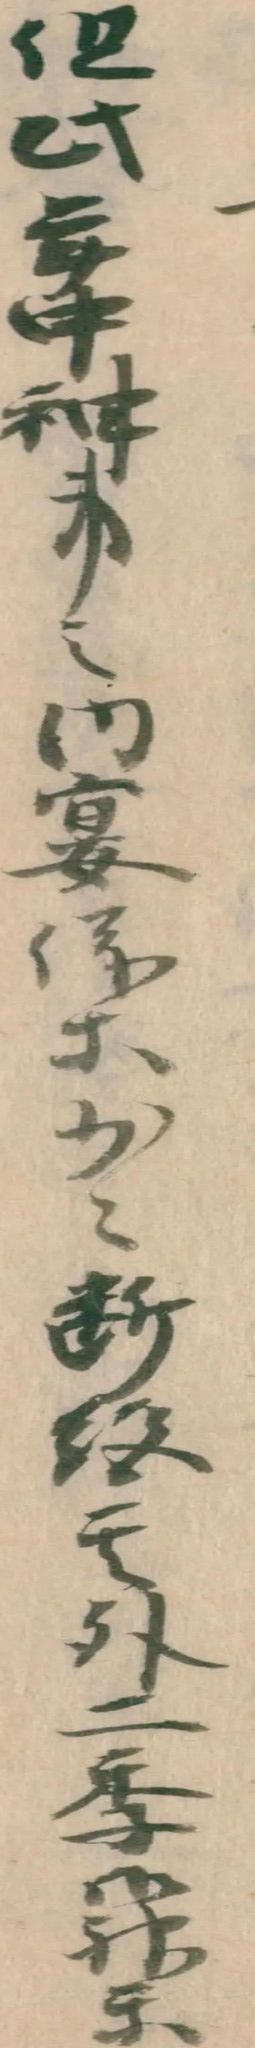但此年中神事之内宴儀等少々断絶其外二季御神楽
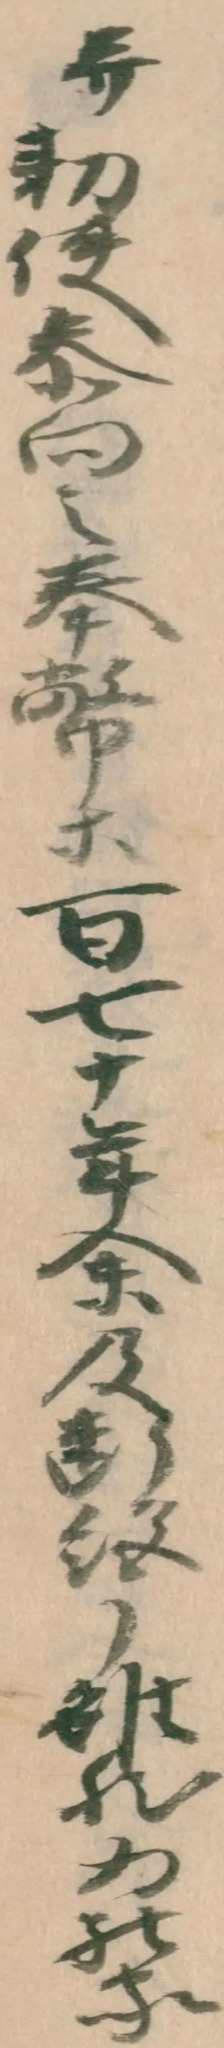并勅使参向之奉幣等百七十年余及断絶之雖然為社家
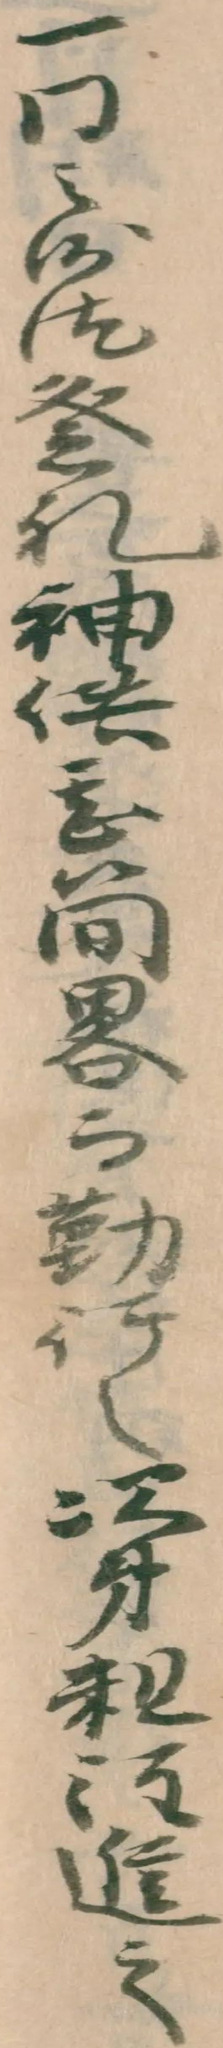一同之沙汰祭礼神供甚簡略而勤行之次第粗注進之
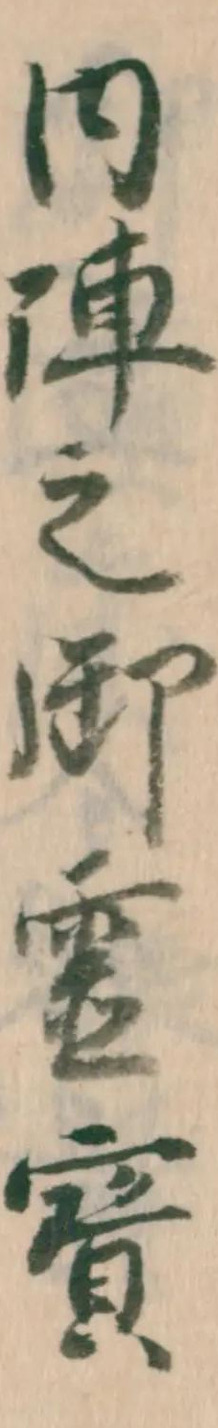内陣之御霊宝
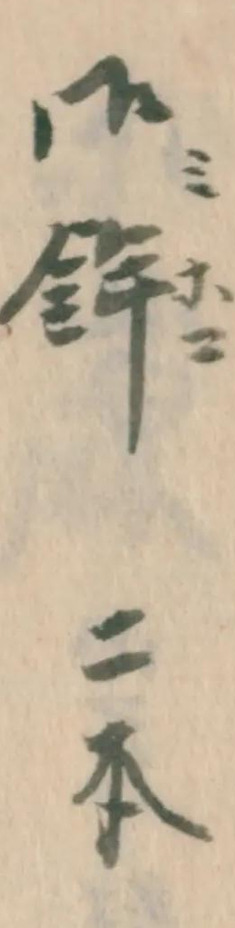御鉾二本
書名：賀茂社記録. 第1冊
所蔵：国立国会図書館 National Diet Library, JAPAN
